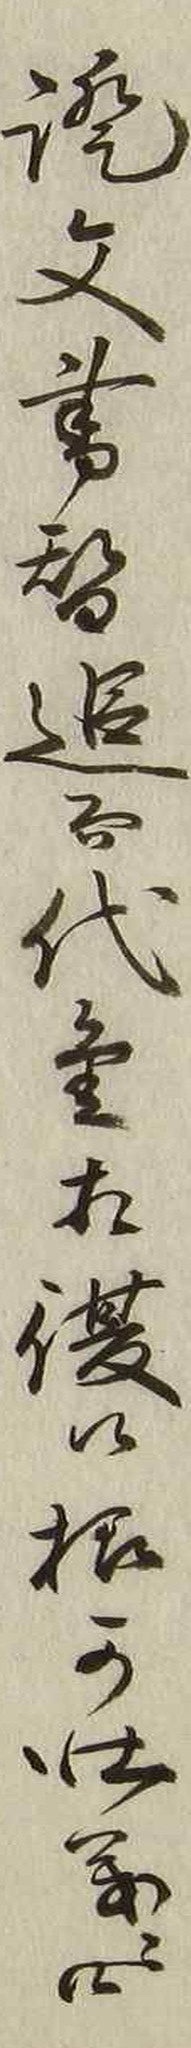証文書替追而代金相復候様可仕儀ニ候
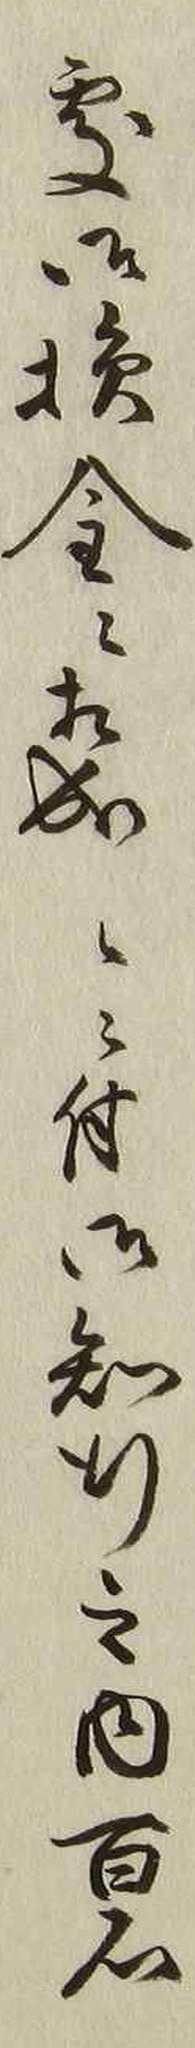処御損金ニ相成候ニ付御知行之内百石
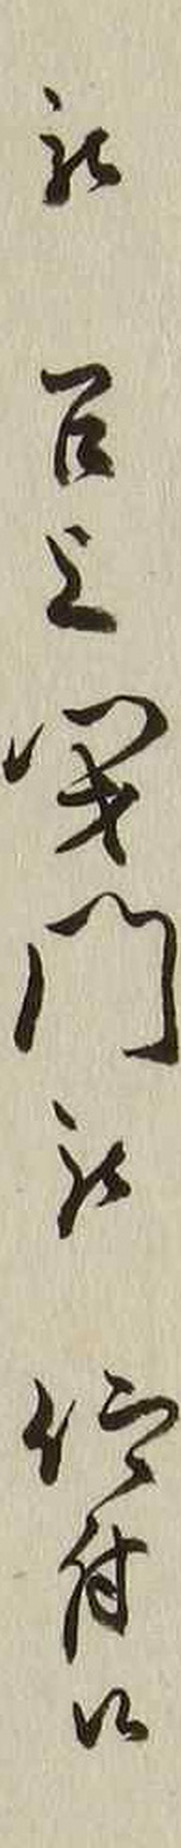被召上閉門被仰付候
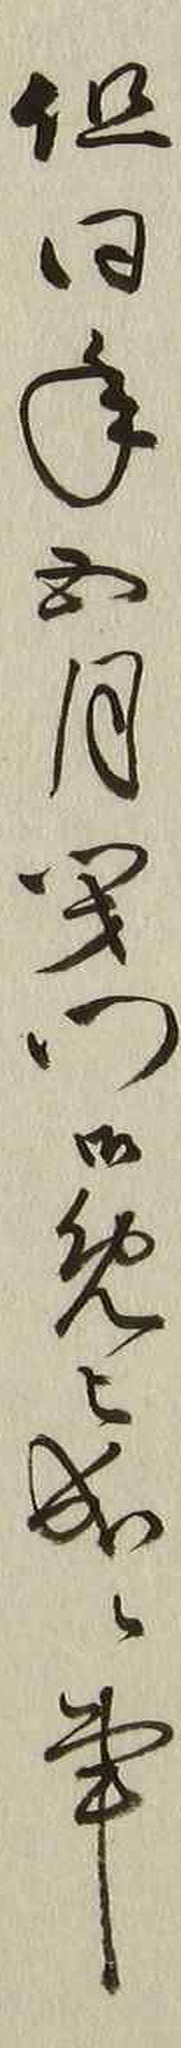但同年五月閉門御免被成候事
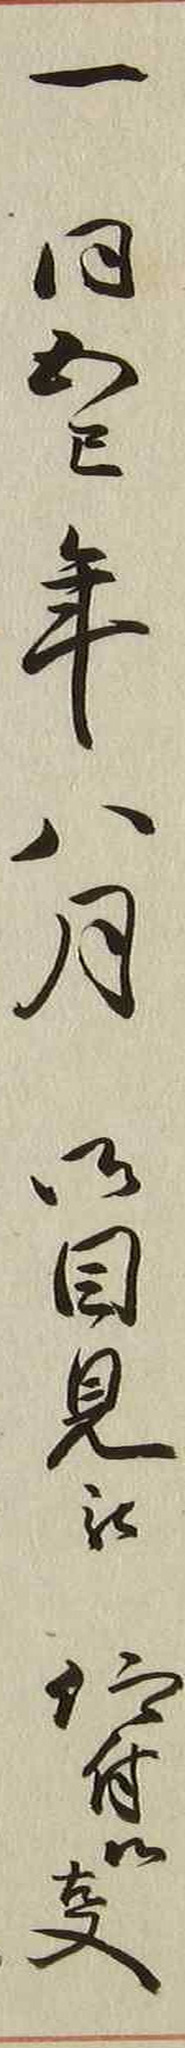一同五巳年八月御目見被仰付候事
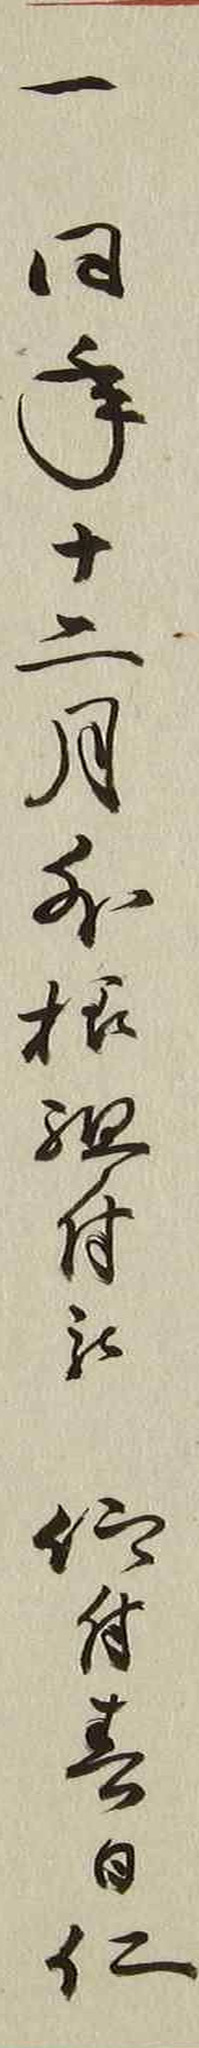一同年十二月外様組付被仰付春日仁
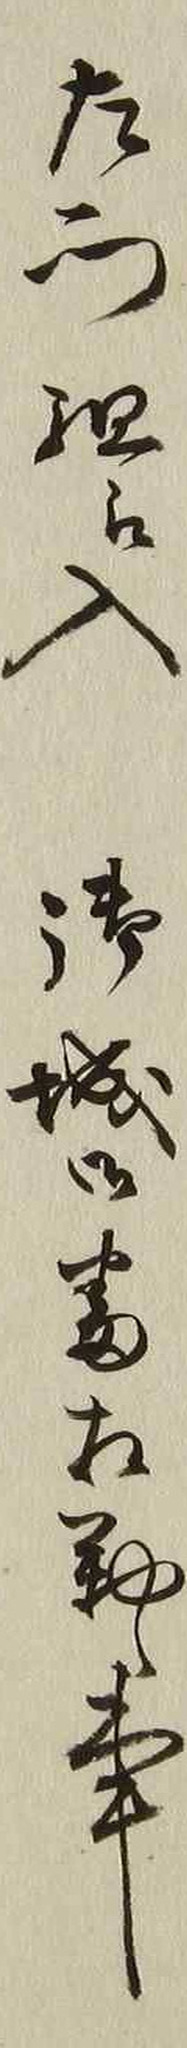左エ門組江入御城御番相勤候事
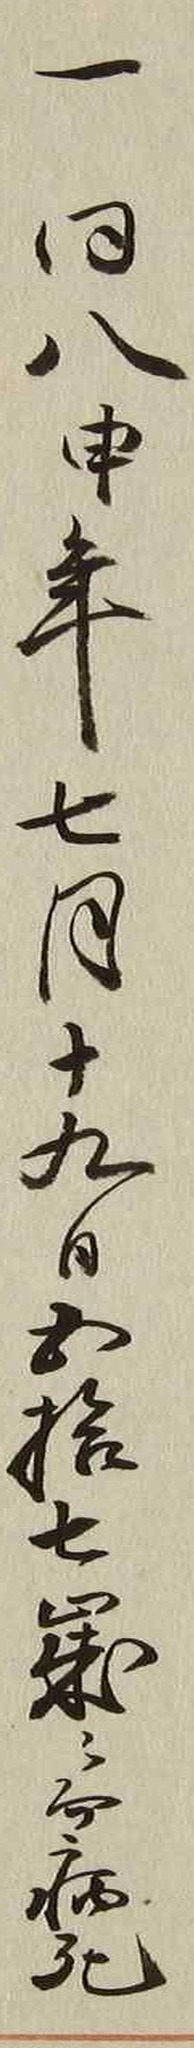一同八申年七月十九日五拾七歳ニ而病死
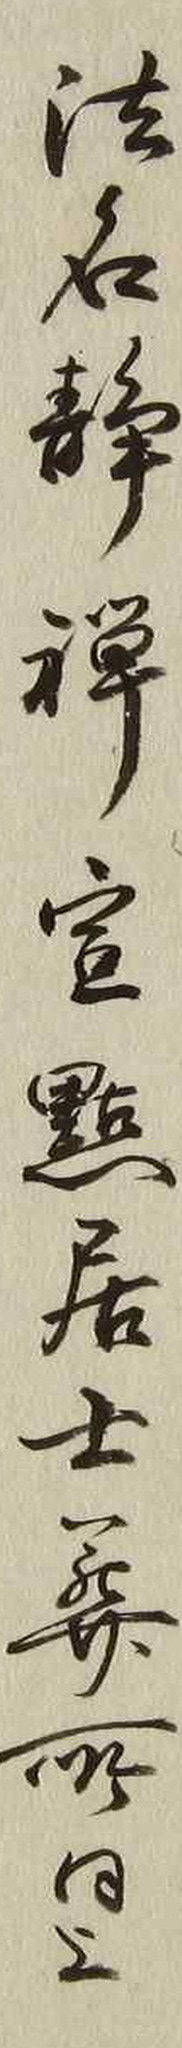法名静禅宣点居士葬所同上
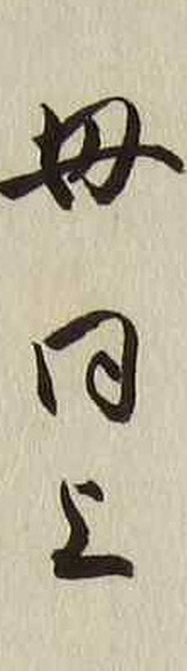母同上
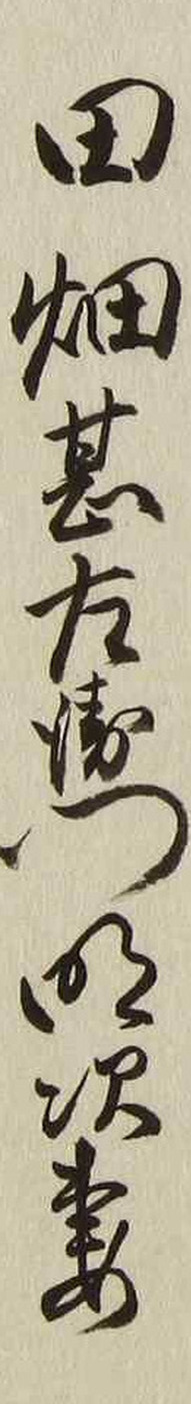女田畑甚左衛門明次妻
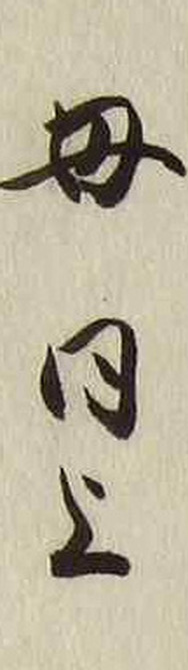母同上

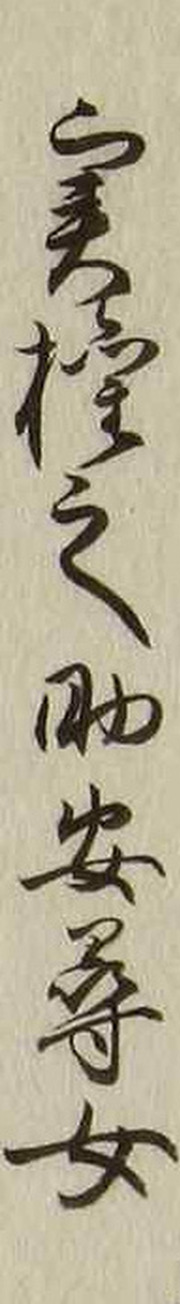実権之助安尋女
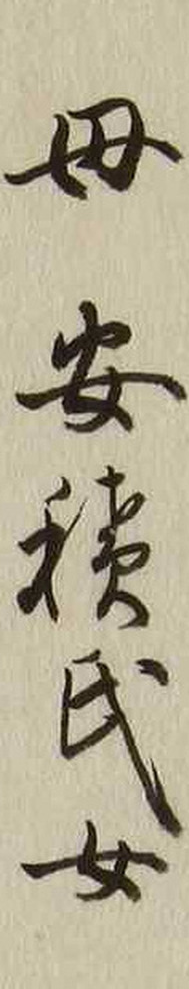母安積氏女
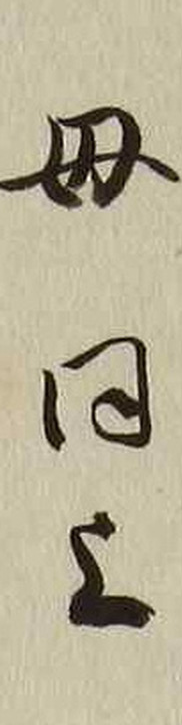母同上
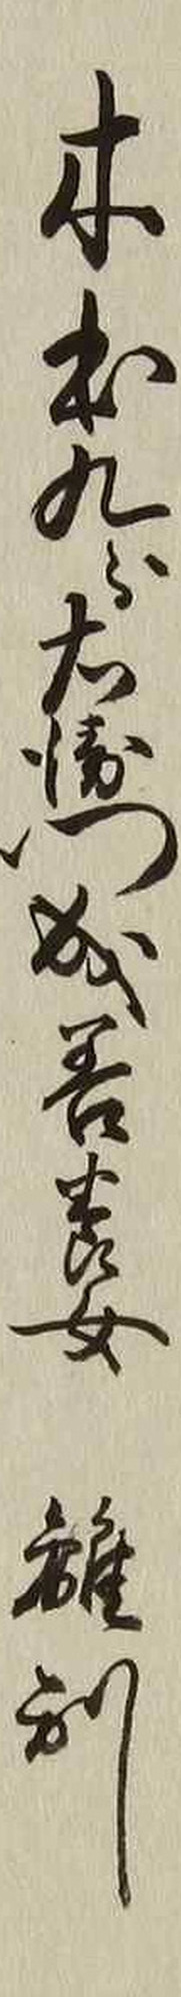木本九郎右衛門成善養女離別
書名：諸士系譜　巻之15　い之部15
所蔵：会津若松市立会津図書館
